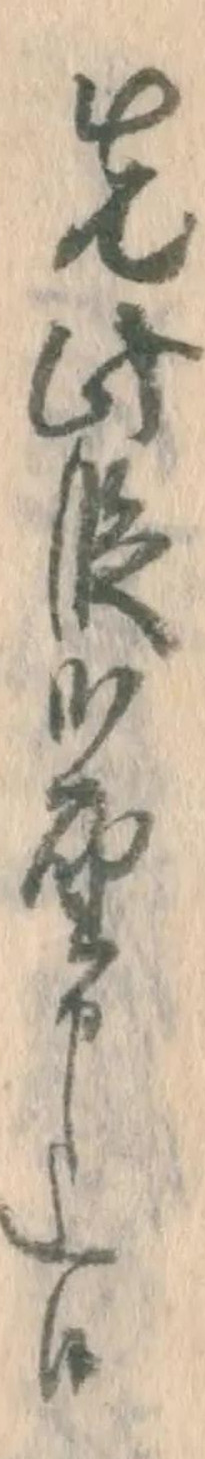先此段御届申上候
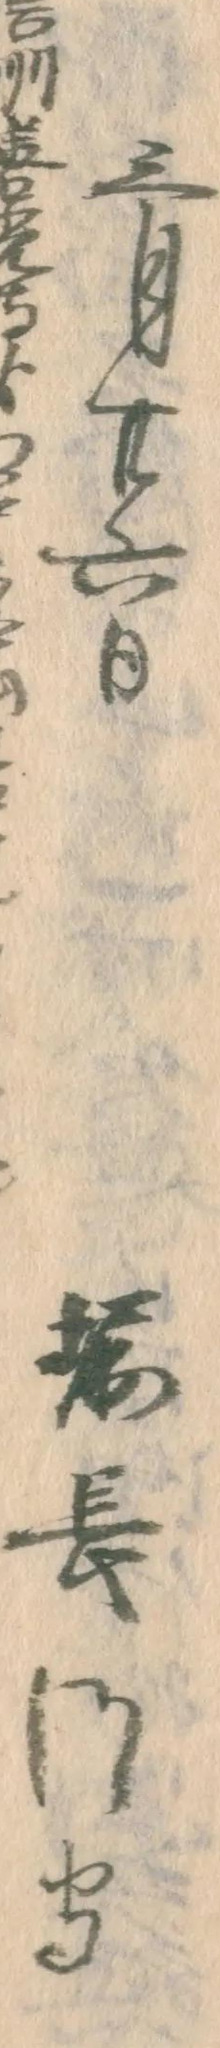三月廿六日堀長門守
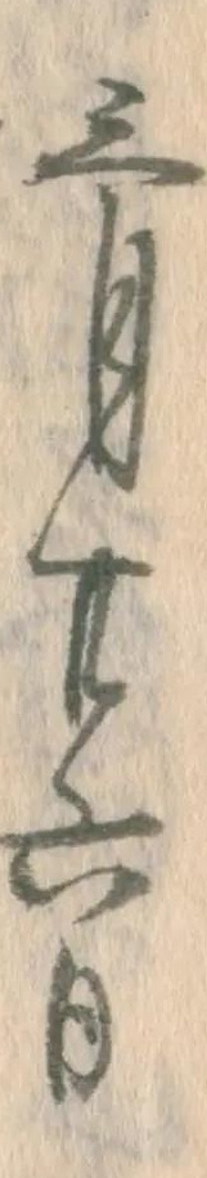三月廿五日
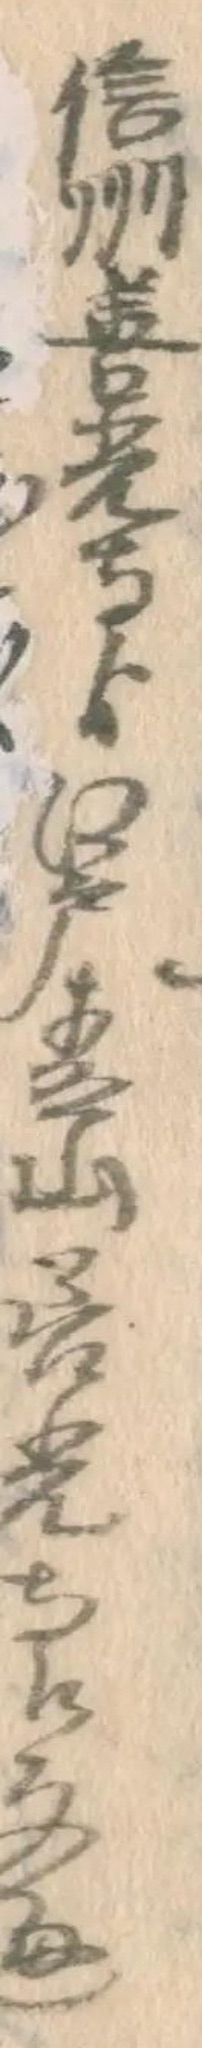信州善光寺ゟ江戸青山善光寺江文通
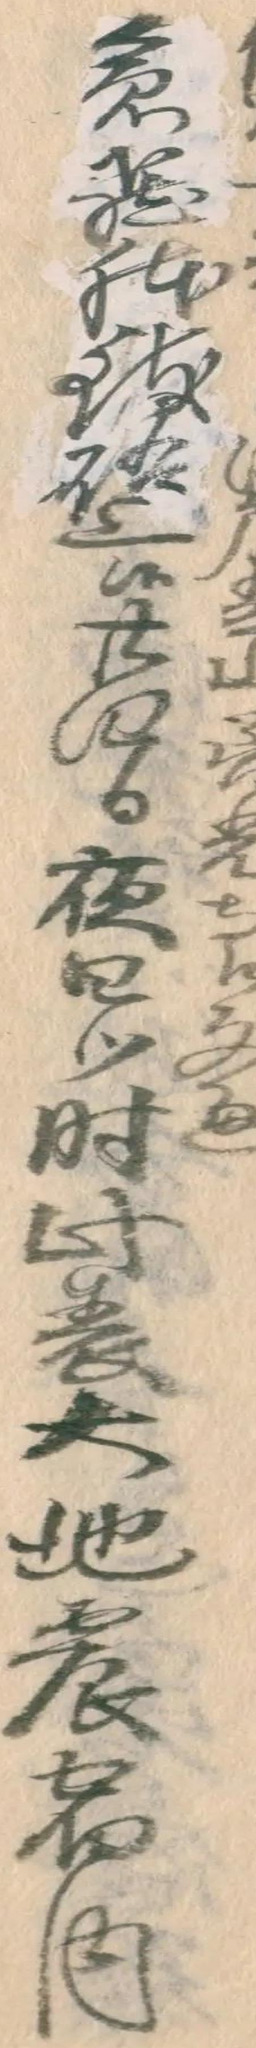急飛脚致啓上候廿四日夜四ッ時此表大地震宿内
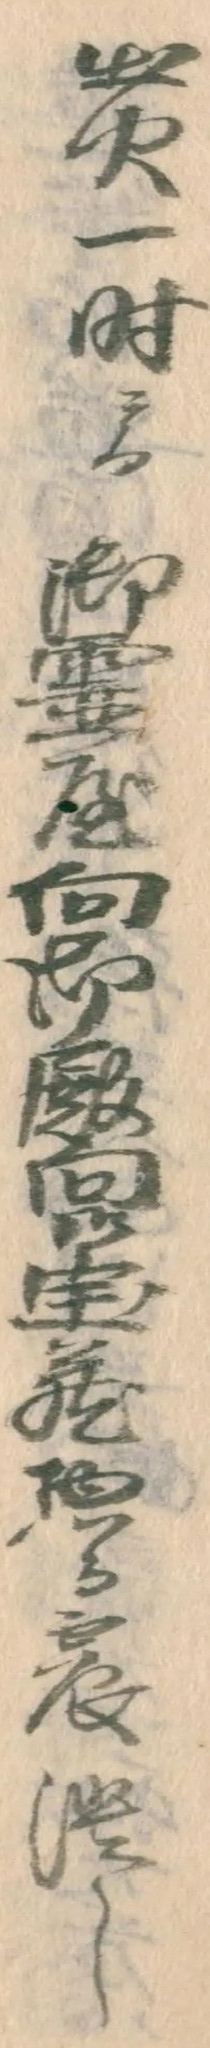出火一時二而御霊屋向御殿向御宝蔵忽ち震潰し
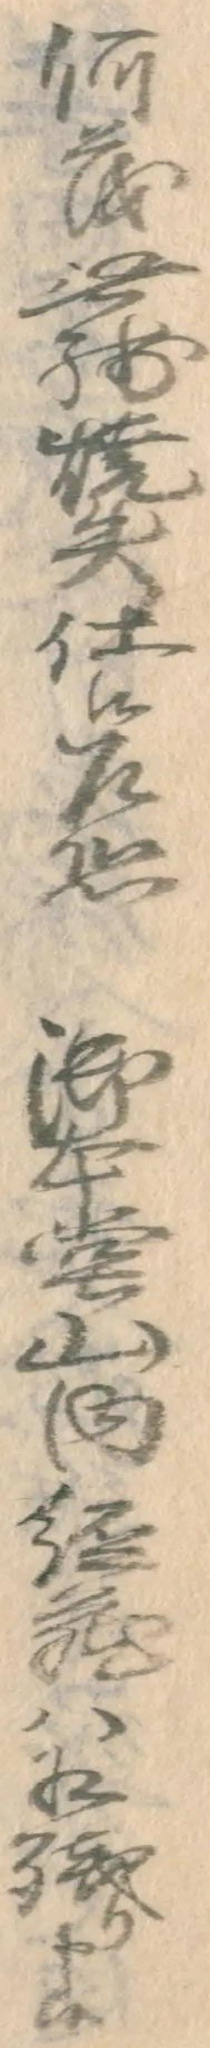何も無残焼失仕候乍恐御本堂山内経蔵ハ相残り申候

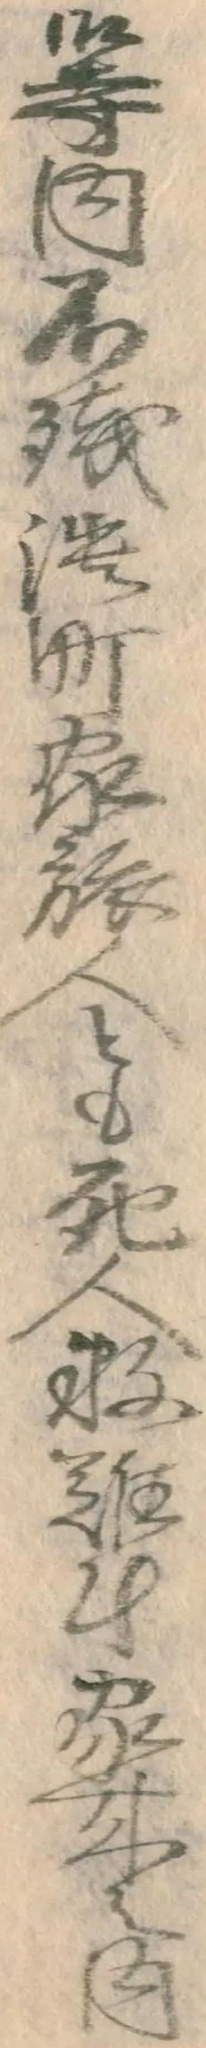御寺内不残潰町家旅人とも死人数難斗家来之内
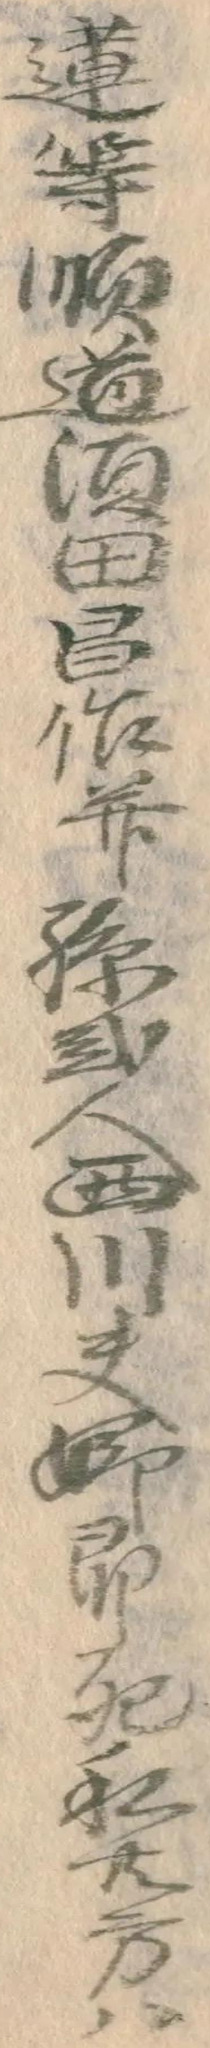蓮等順道須田昌作并孫弐人西川夫婦即死私共方ハ
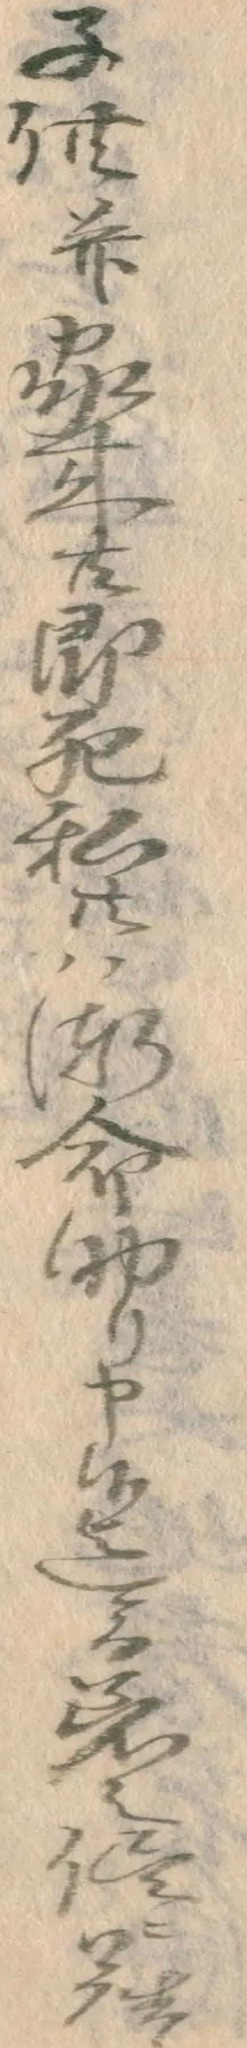子供并家来共即死私共ハ漸命助り申候迄二而着之儘二御座候
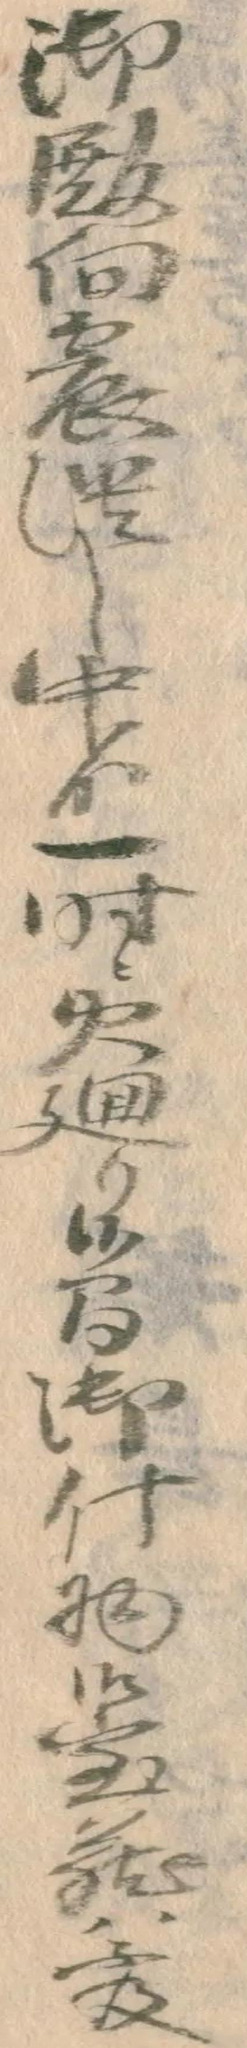御殿向震潰し中ゟ一時二火廻り候間御什物御宝蔵ハ不及
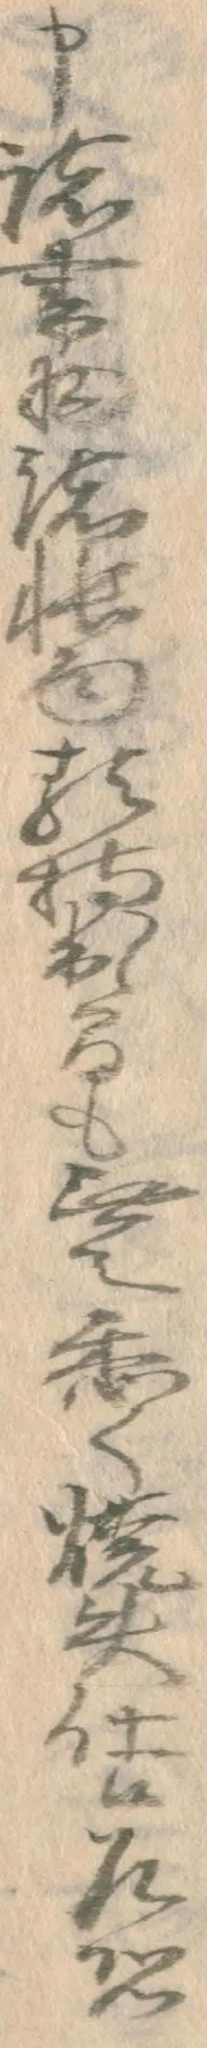申諸書物諸帳面類持出し候間も無之悉く焼失仕候乍恐
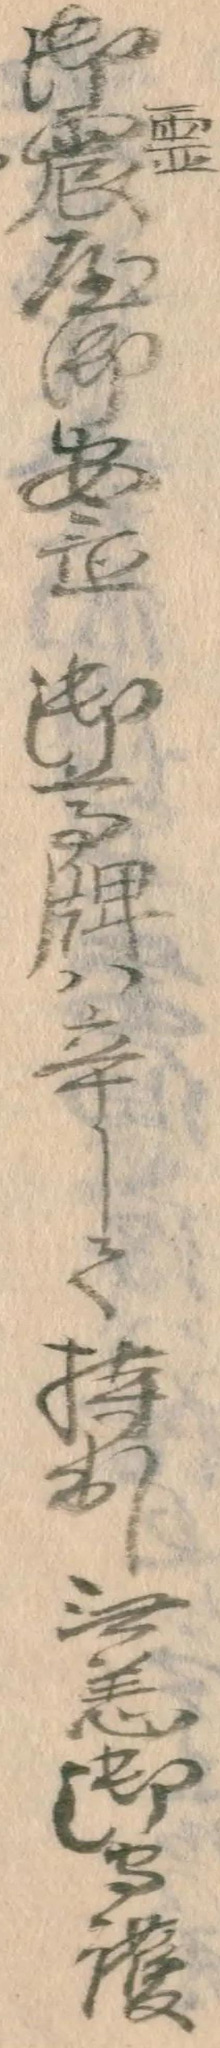御霊屋御安置御尊牌ハ辛して持出し無恙御守護
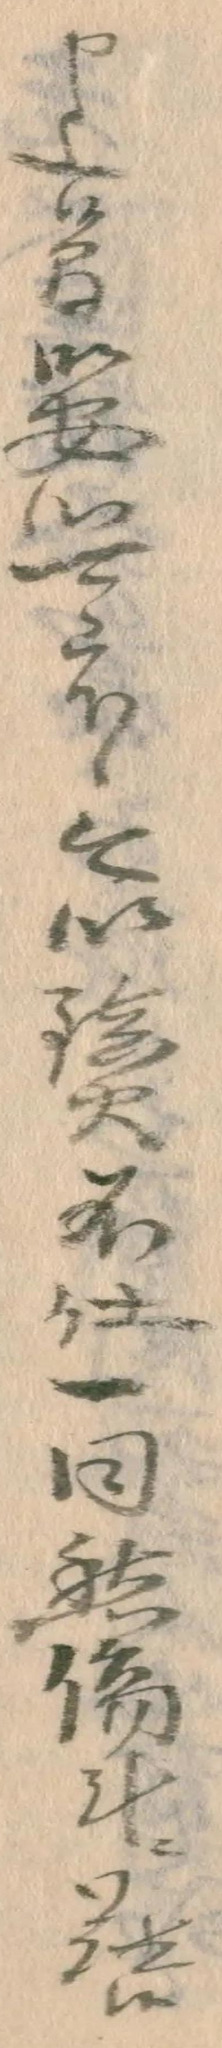申上候間御安心可被下候今以鎮火不仕一同愁傷斗二御座候
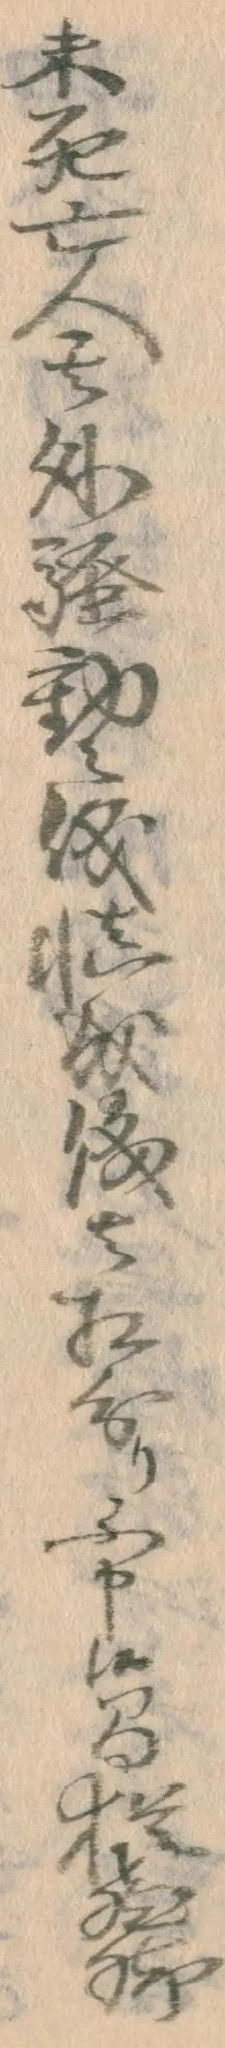未死亡人其外騒動之儀慥成儀者相分り不申候間猶飛脚
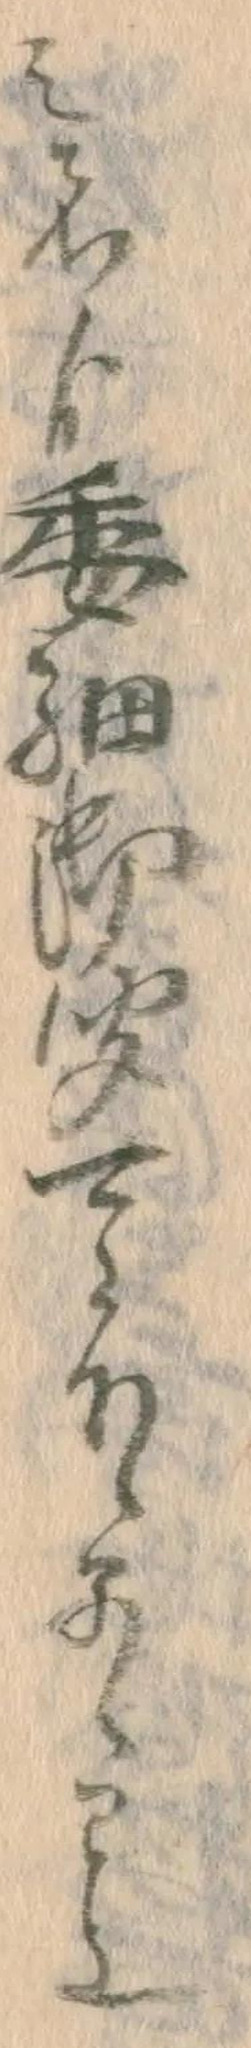之者ゟ委細御聞可被下候早々已上
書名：信州大地震之記
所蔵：国立国会図書館 National Diet Library, JAPAN
